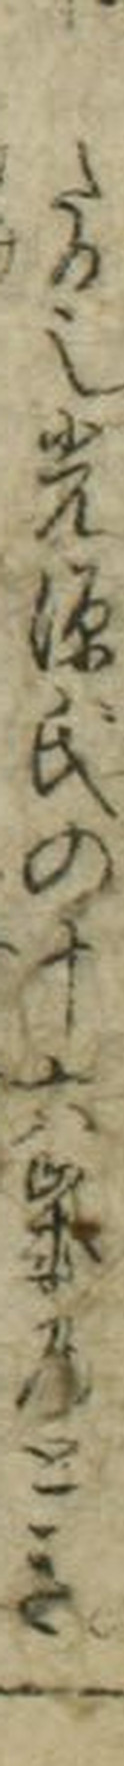たる也。光源氏の十六歳のとき。
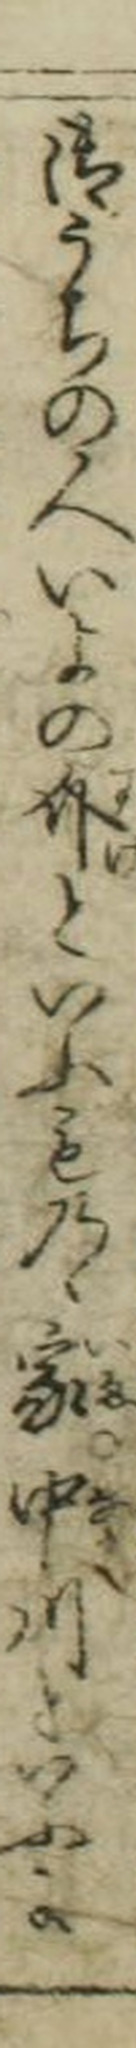御うちの人いよの介といふものゝ家。中川といふに
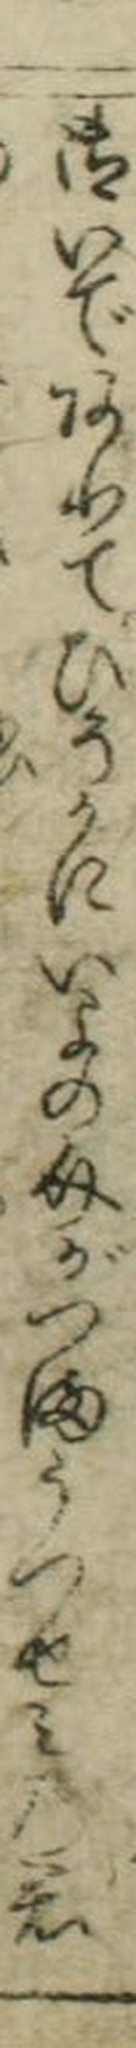御いでありて。ひうかにいよの介がつまうつせみの君
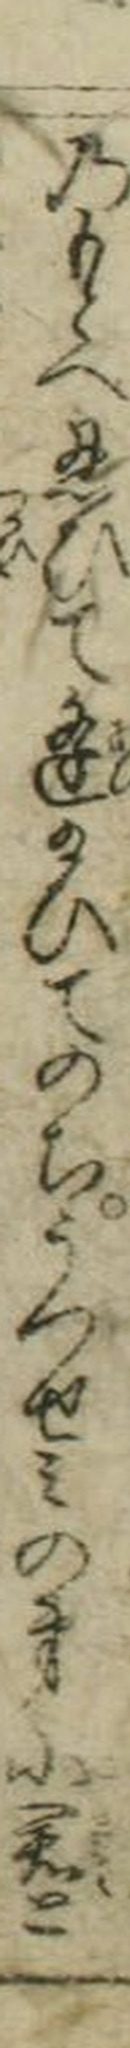のもとへ忍ひて逢給ひてのち。うつせみの弟小君と
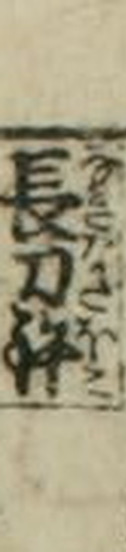長刀鉾
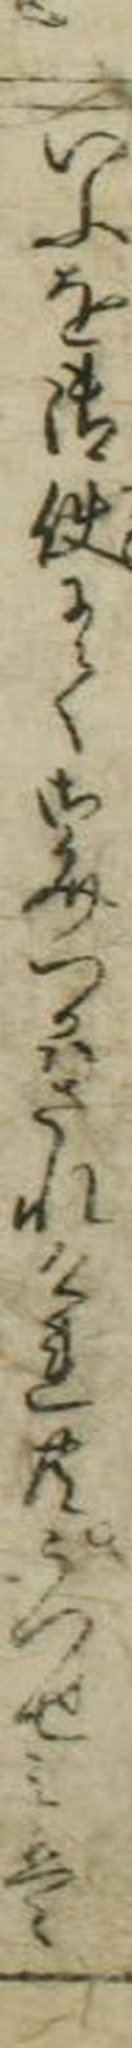いふを御使にて御みつかはされけれ共。うつせみは
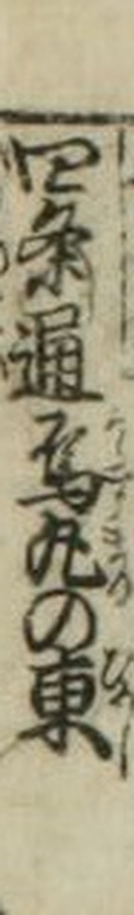四条通烏丸の東
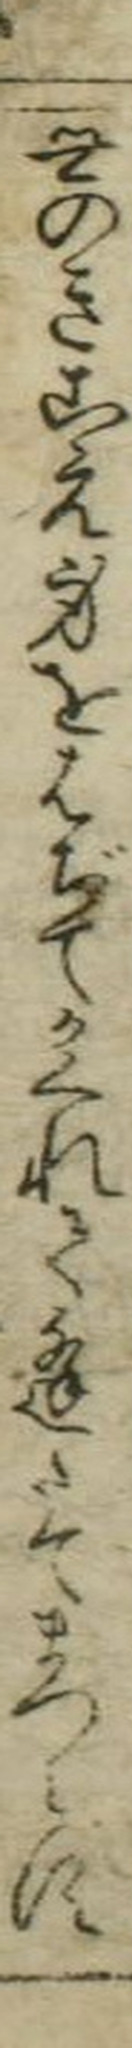世のきこえ身をはぢてかくれて逢たてまつらす
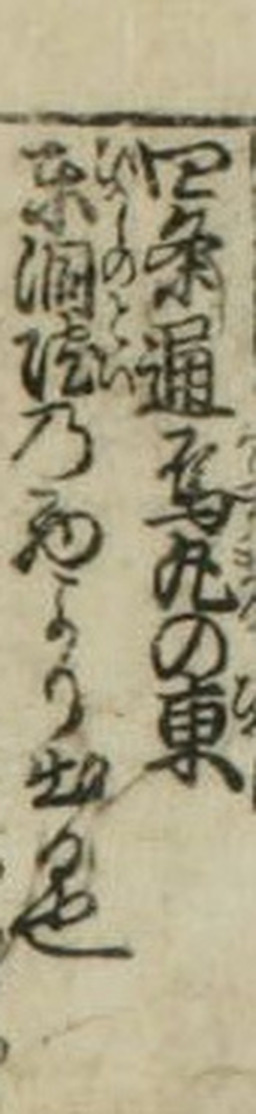東洞院の西より出る也
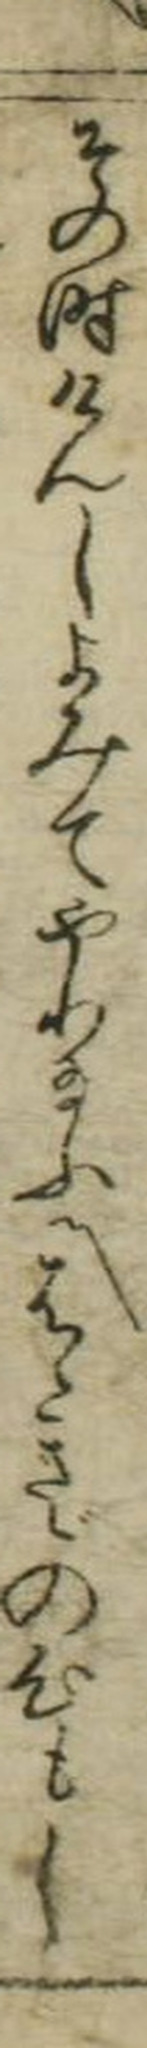その時けんしよみてやり給ふ〽はゝきゞの心もし
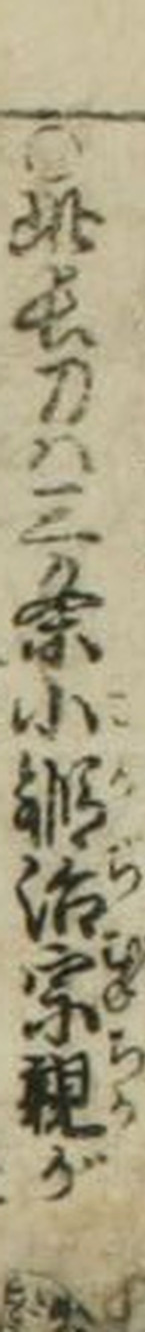〇此長刀は三条小鍛冶宗親が
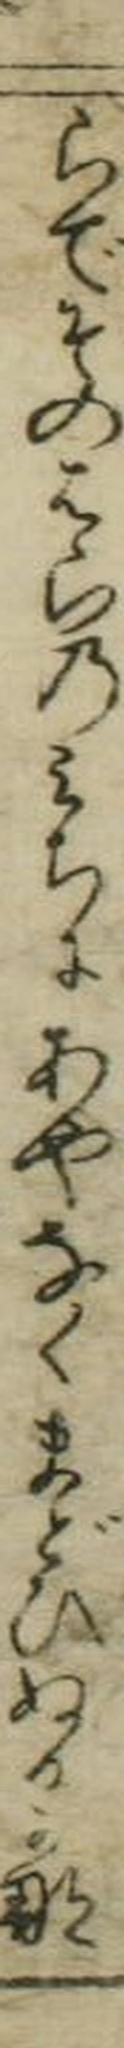らでそのはらのみちにあやなくまどひぬるかな
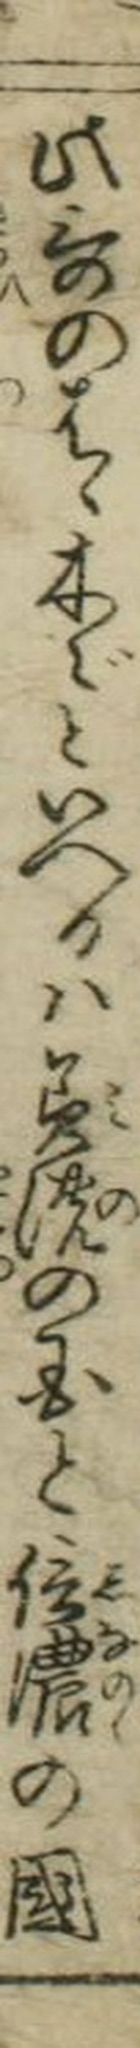此哥のはゝ木ゞといへるは美濃の国と信濃の国
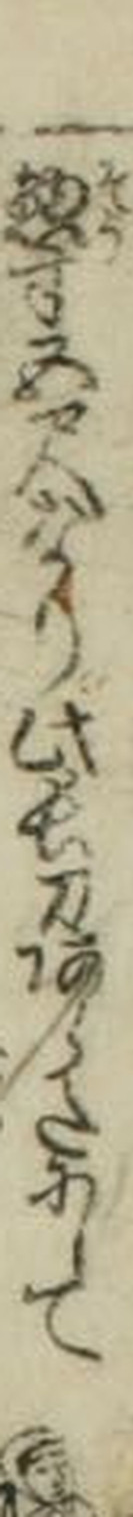惣寸五尺なり。此長刀あらたにして
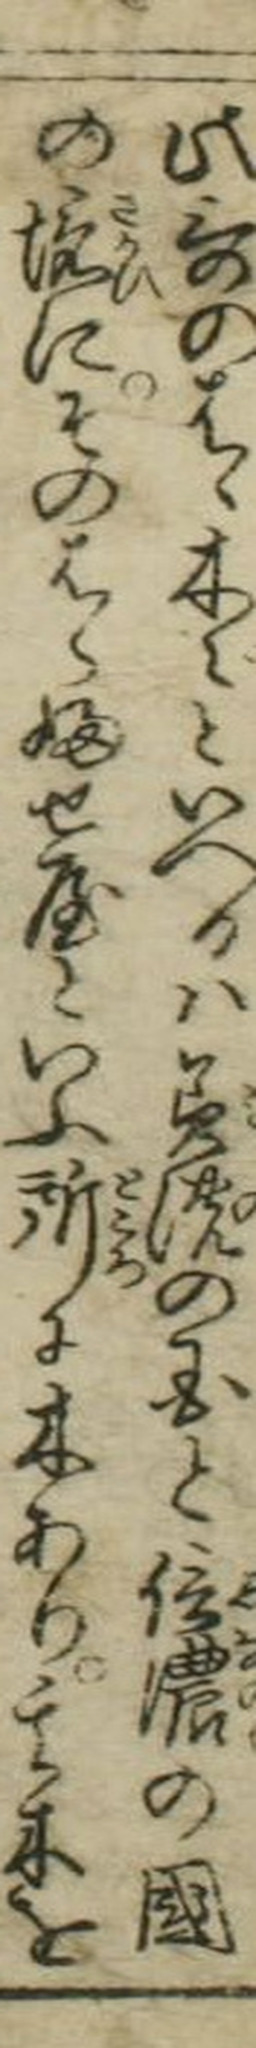の境に。そのはらふせ屋といふ所に木あり。其木を
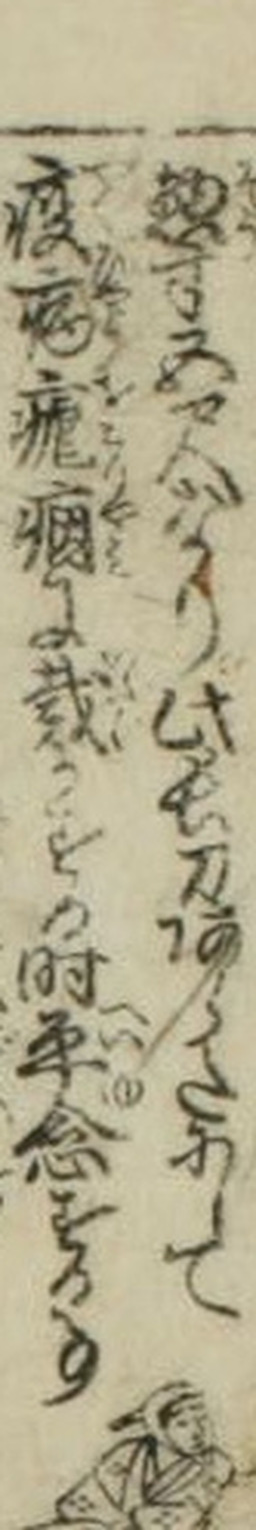疫病瘧病に戴かする時平念する事
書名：女源氏教訓鑑
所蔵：東京学芸大学附属図書館
